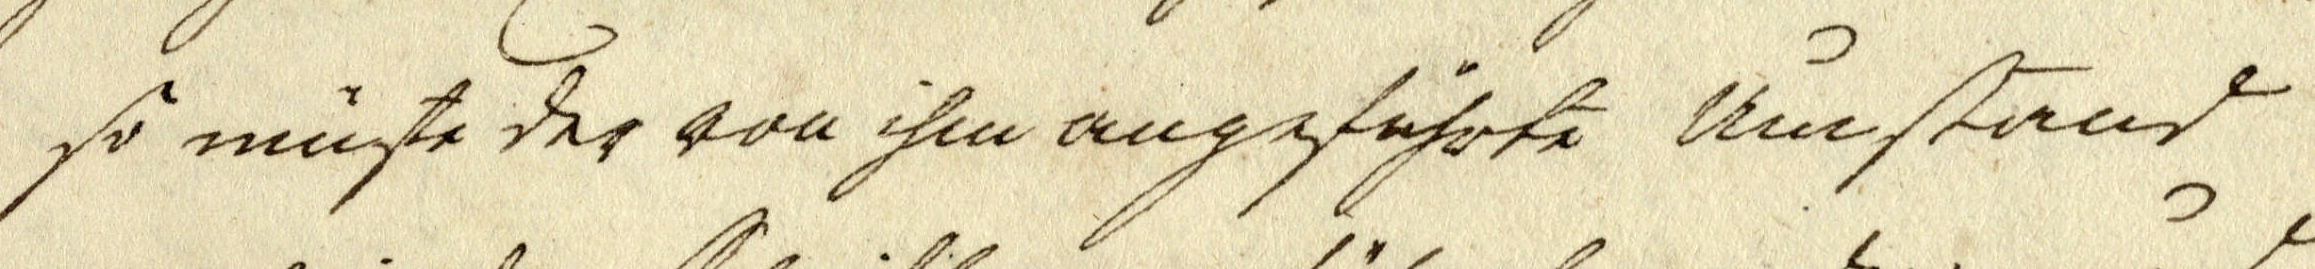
so müßte der von ihm angeführte Umstand
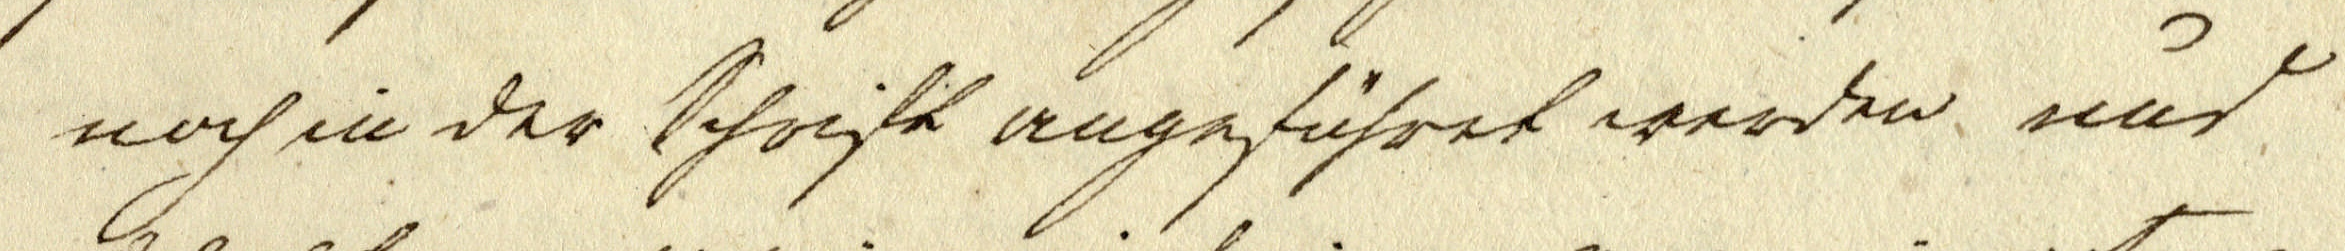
noch in der Schrift angeführet werden und
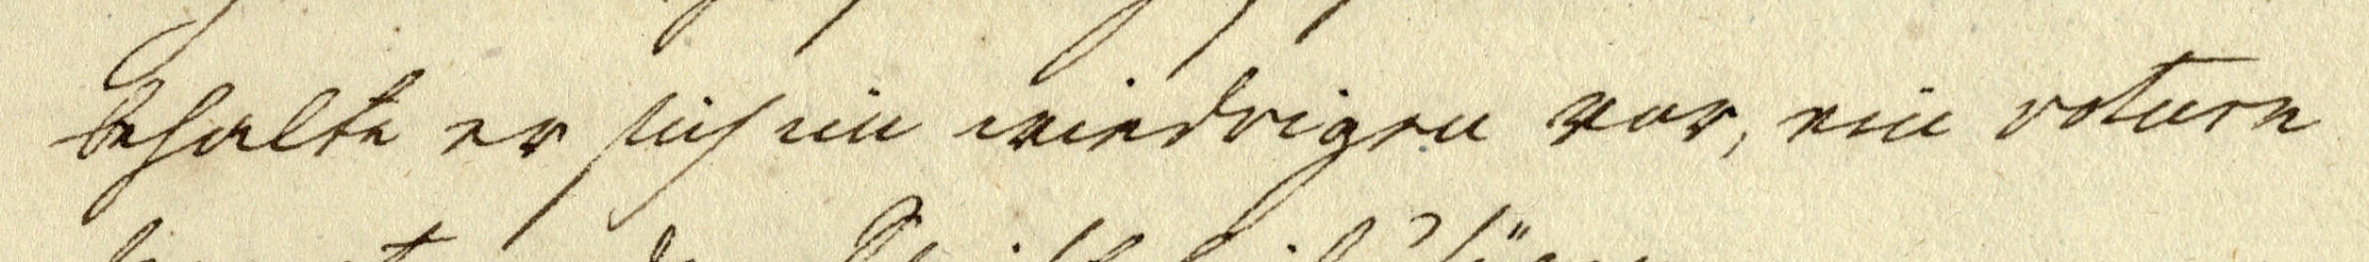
behalte er sich im wiedrigen vor, ein votum
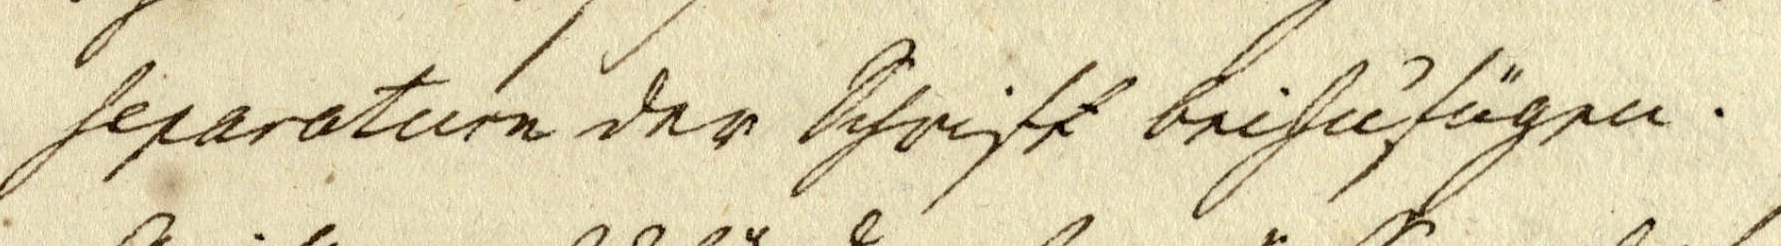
separatum der Schrift beizufügen.
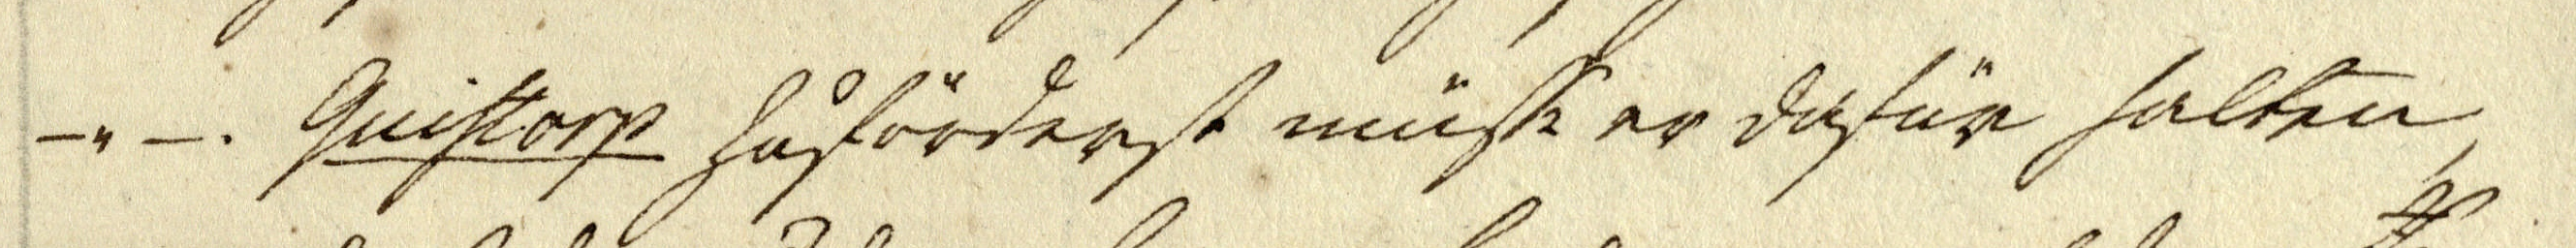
Quistorp zuförderst müsse er dafür halten,
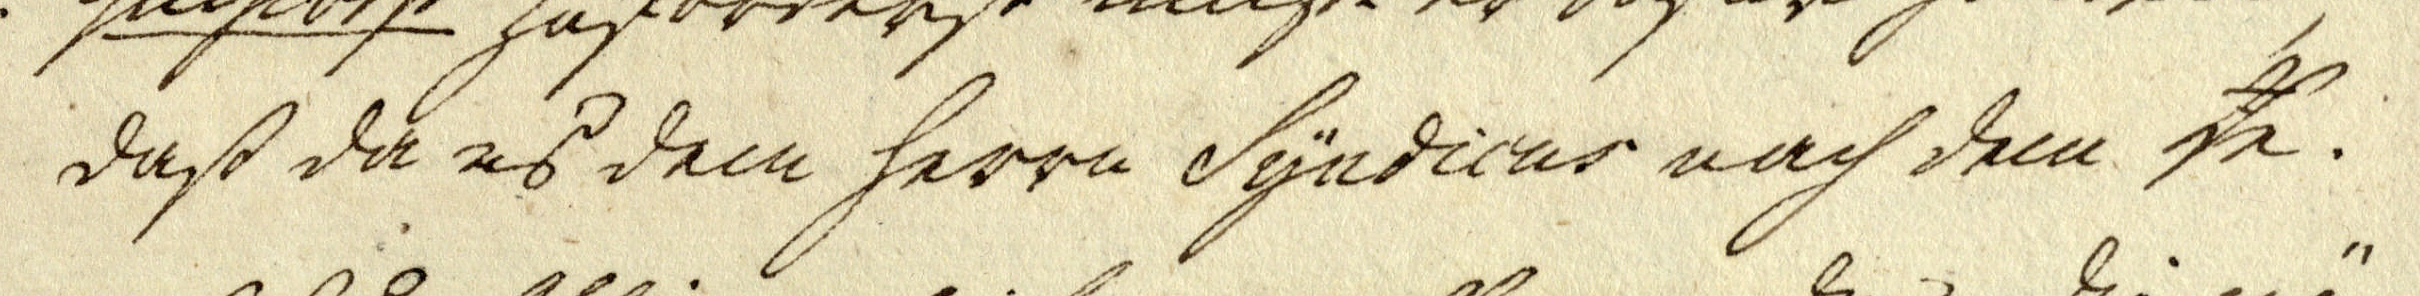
daß da es dem Herrn Sÿndicus nach dem Re¬
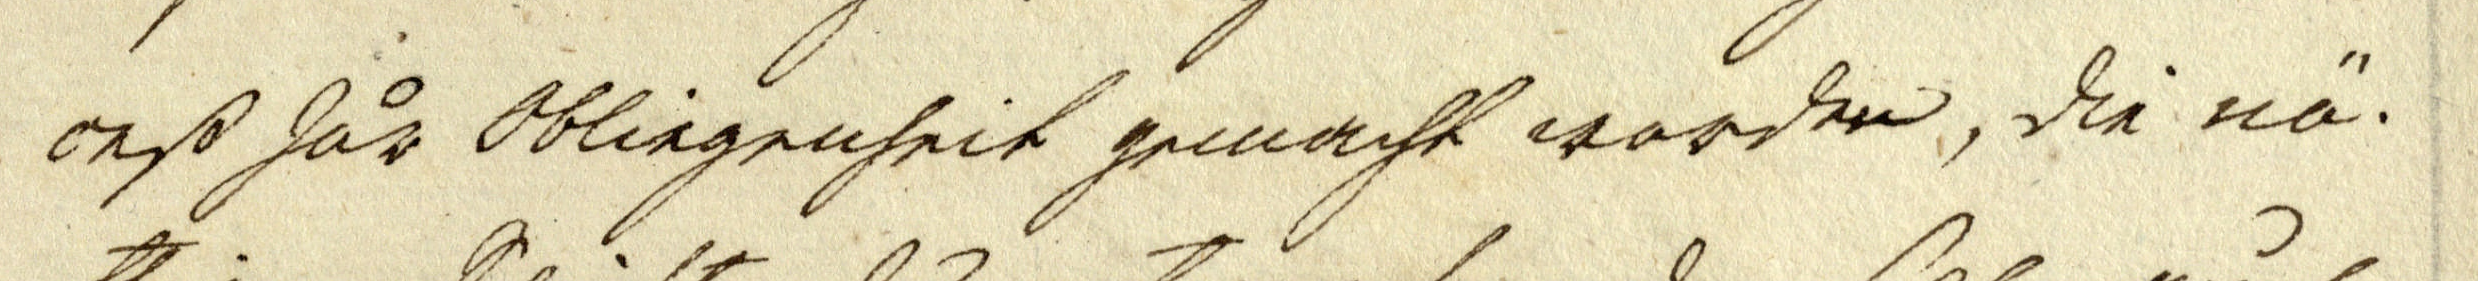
ceß zur Obliegenheit gemacht worden, die nö¬
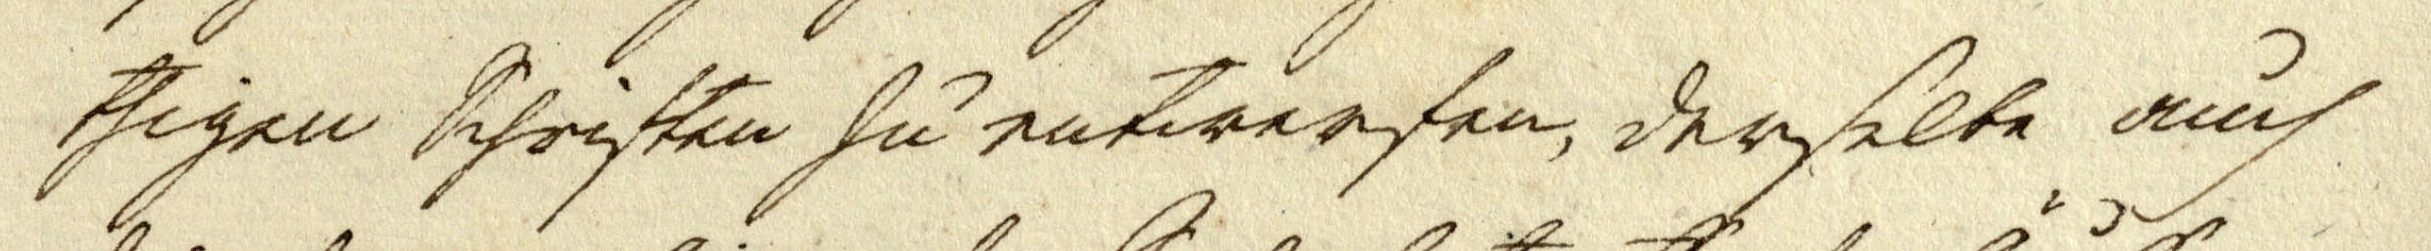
thigen Schriften zu entwerfen, derselbe auch
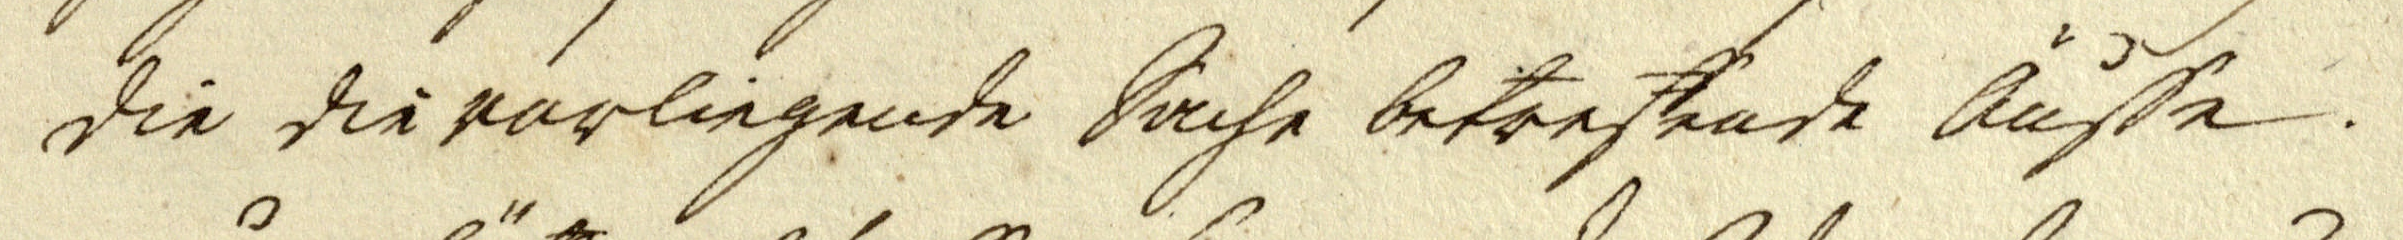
die die vorliegende Sache betreffenden Äusse¬
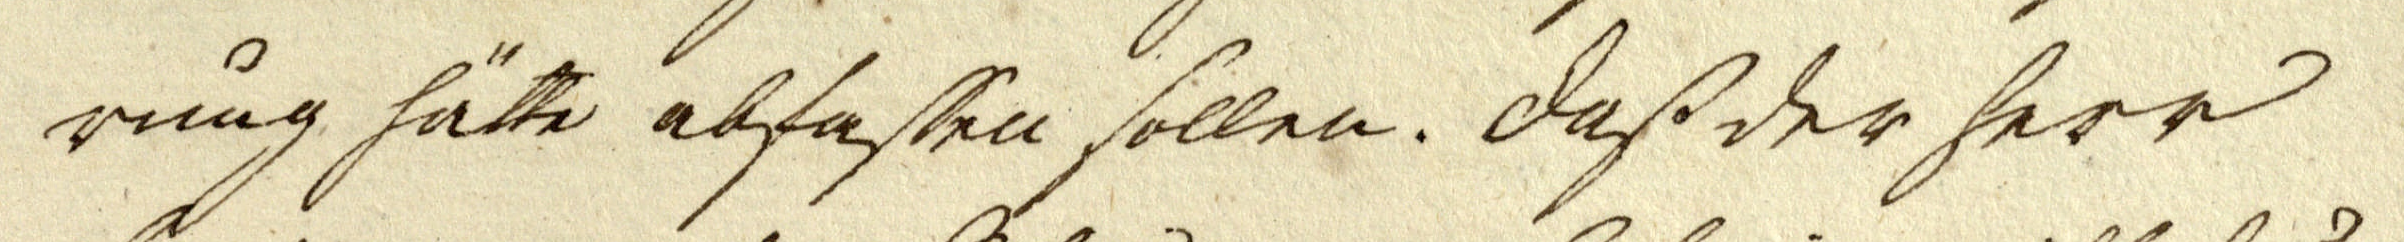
rung hätte abfassen sollen. Daß der Herr
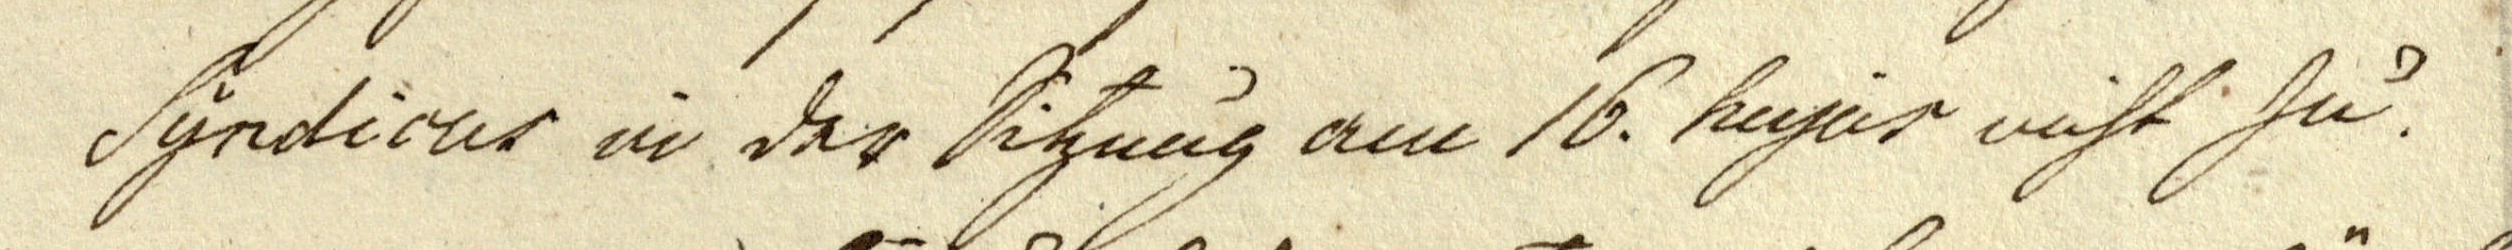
Sÿndicus in der Sitzung am 16. hujus nicht zu
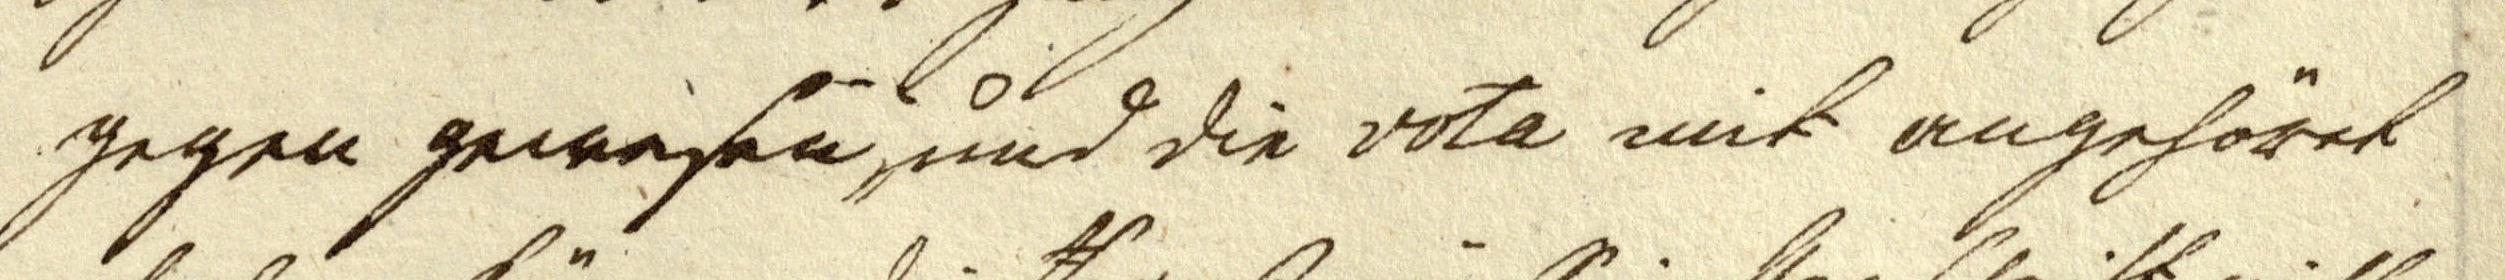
gegen gewesen und die vota mit angehöret
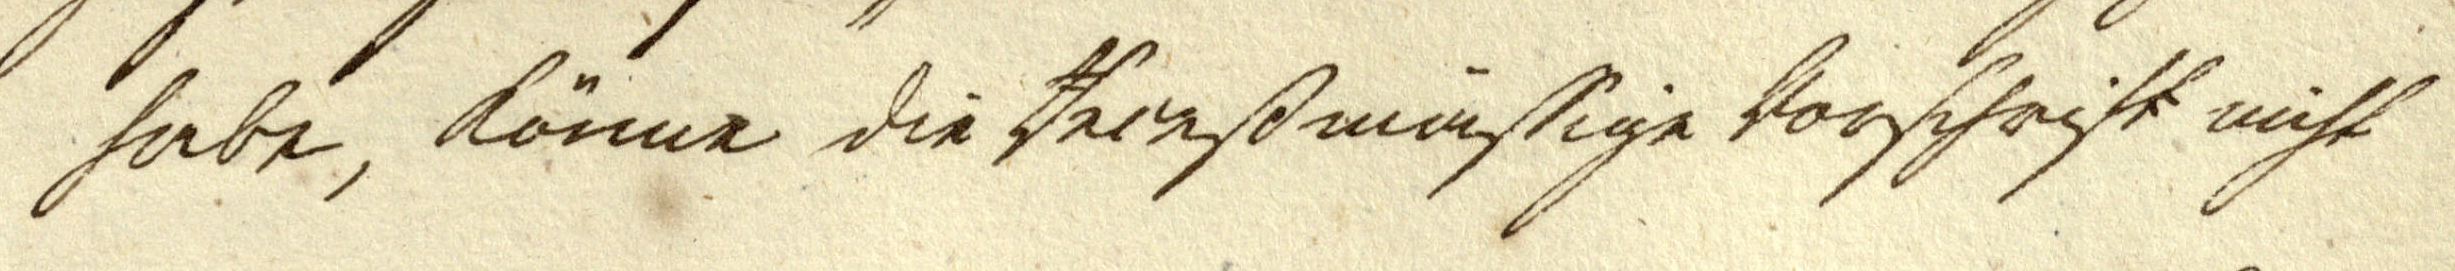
habe, könne die Receßmässige Vorschrift nicht
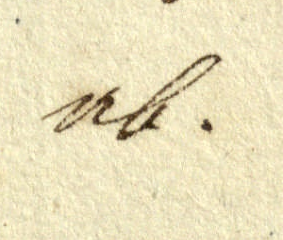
ab¬
